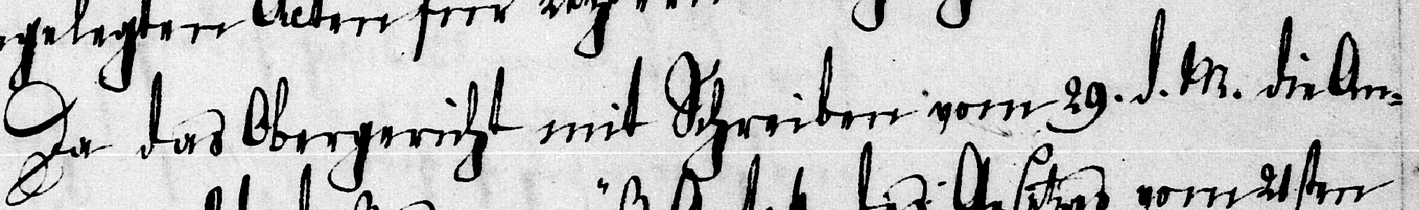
Da das Obergericht mit Schreiben vom 29. d. M. die An¬
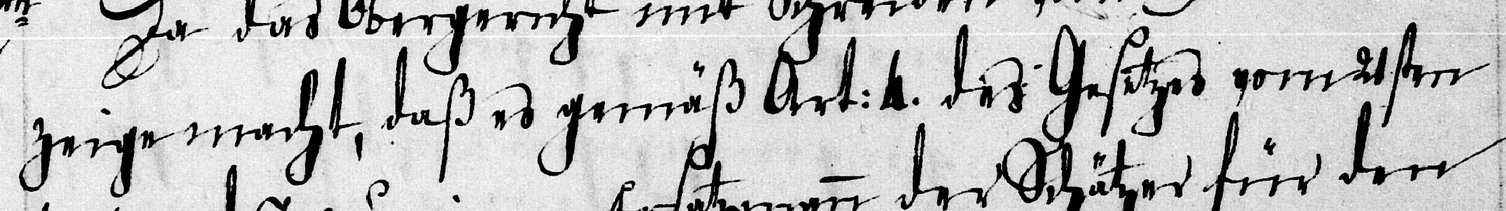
zeige macht, daß es gemäß Art: 4. des Gesetzes vom 21sten
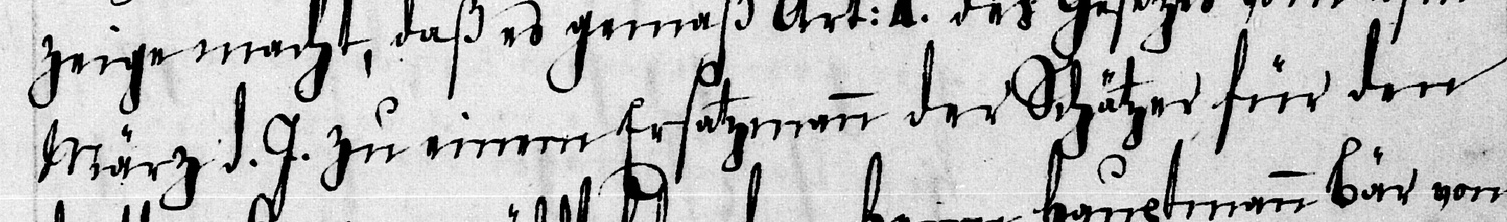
März d. J. zu einem Ersatzmann der Schätzer für den
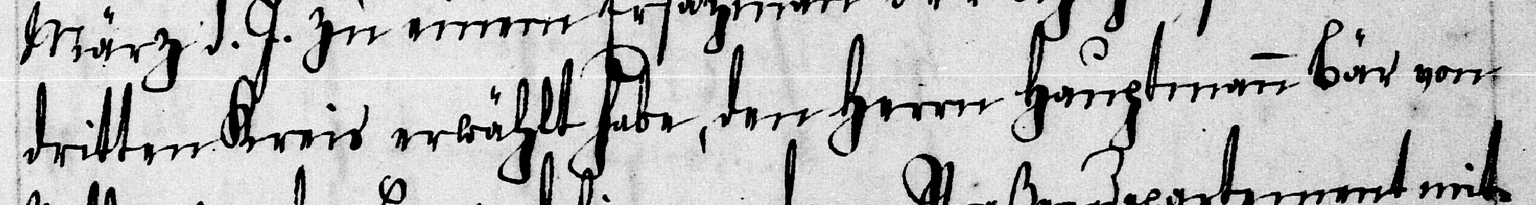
dritten Kreis erwählt habe, den Herrn Hauptmann Bär von
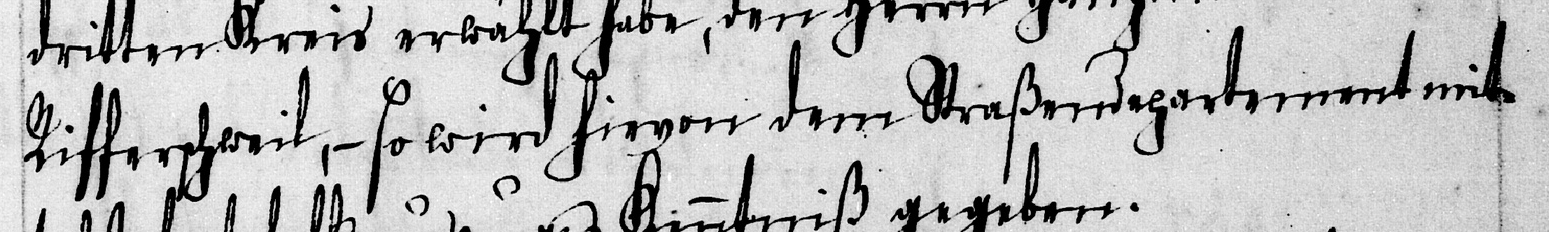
Rifferschweil, – so wird hievon dem Straßendepartement mit¬
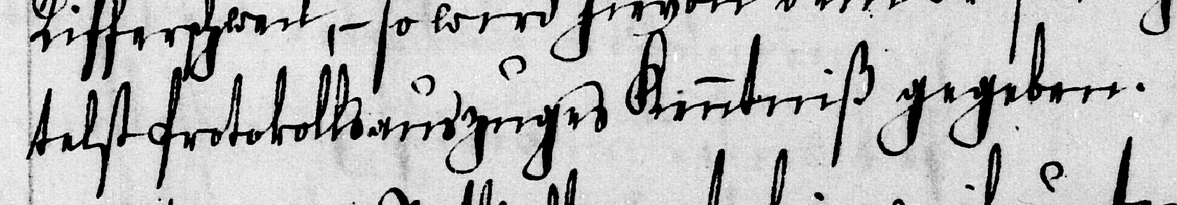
telst Protokollsauszuges Kenntniß gegeben.
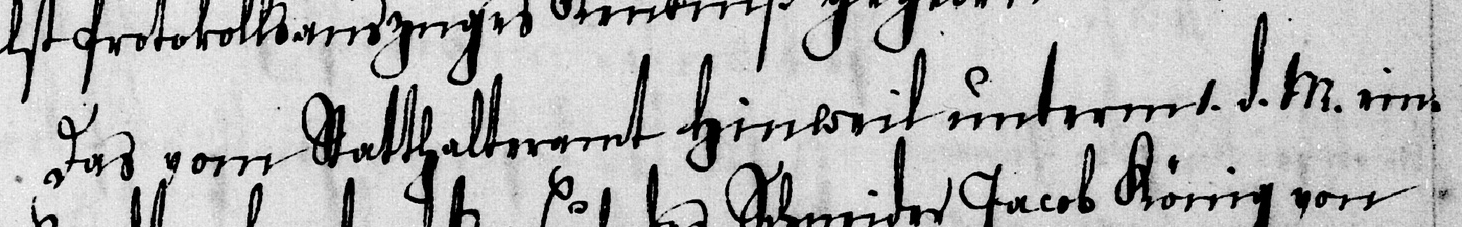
Das vom Statthalteramt Hinweil unterm 1. d. M. ein¬
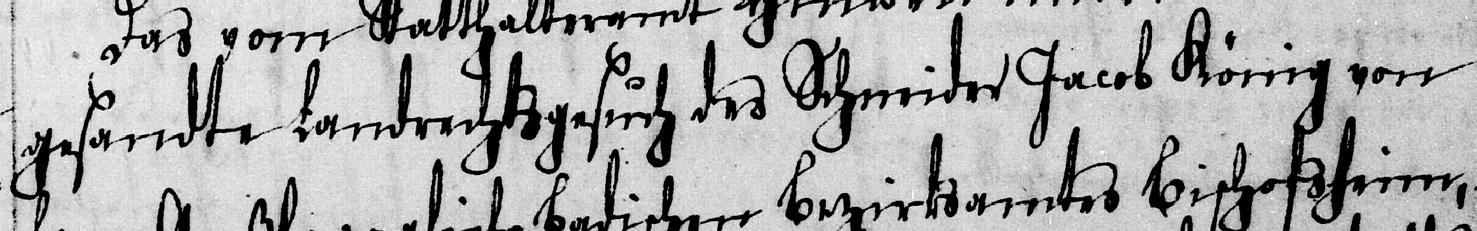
gesandte Landrechtsgesuch des Schneider Jacob König von
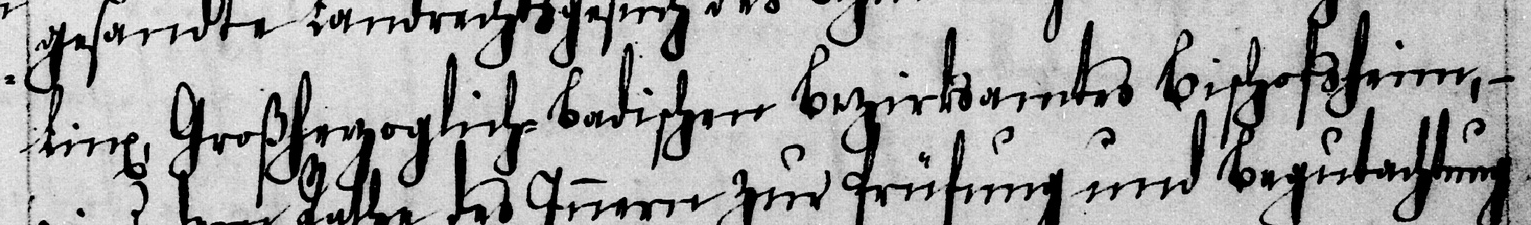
Linx, Großherzoglich-Badischen Bezirksamtes Bischofsheim, –
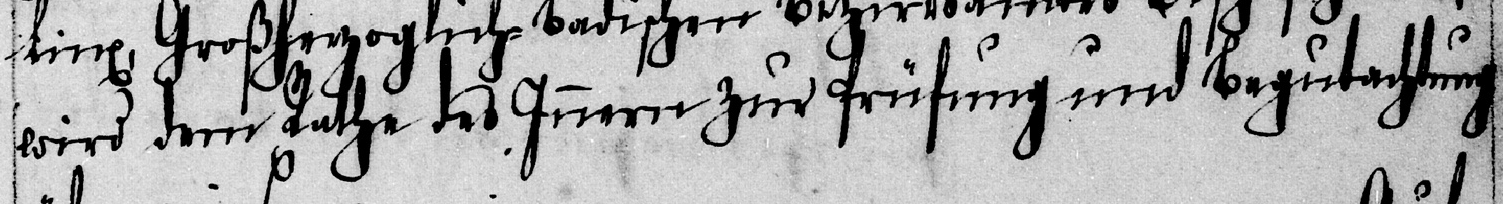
wird dem Rathe des Innern zur Prüfung und Begutachtung
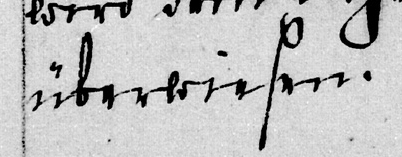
überwiesen.
